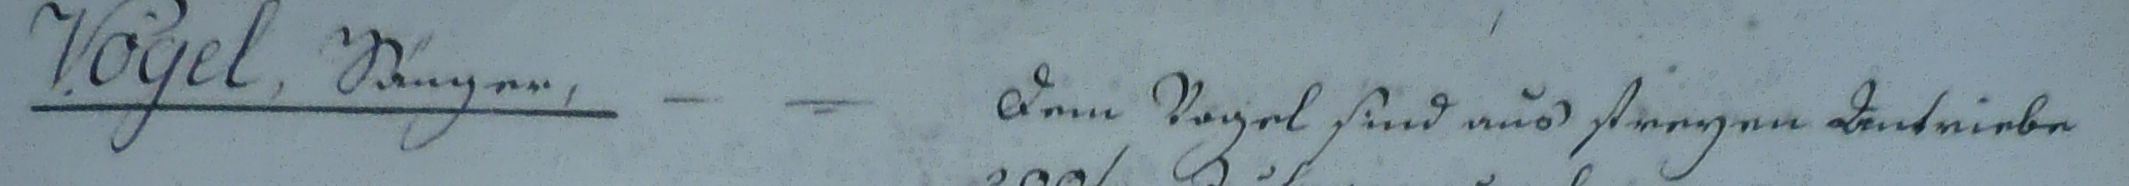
Vogel, Sänger, _ _ Dem Vogel sind aus freyen Antriebe
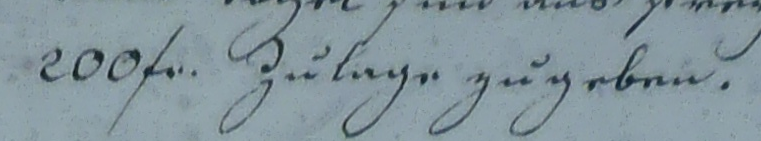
200fr. Zulage zugeben.
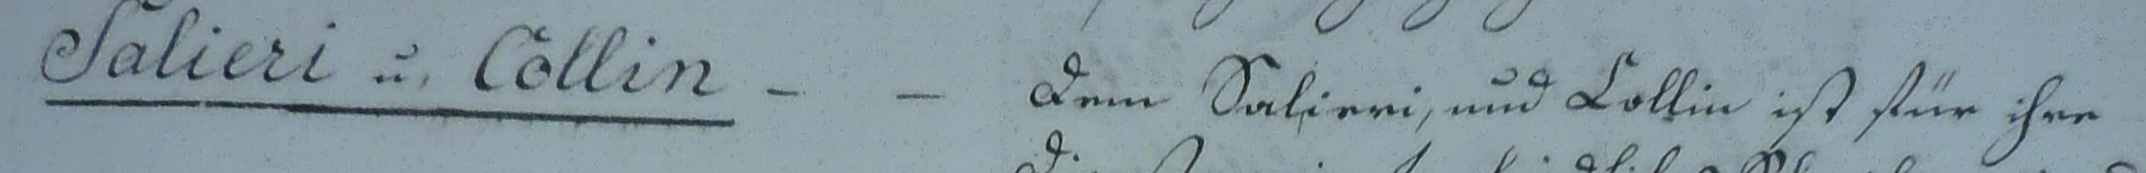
Salieri u, Collin _ _ Dem Salieri, und Collin ist für ihre
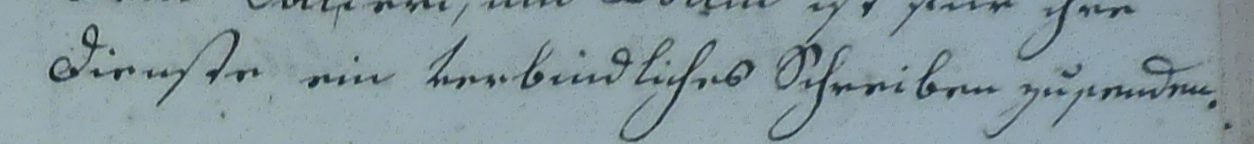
Dienste ein verbindliches Schreiben zusenden.
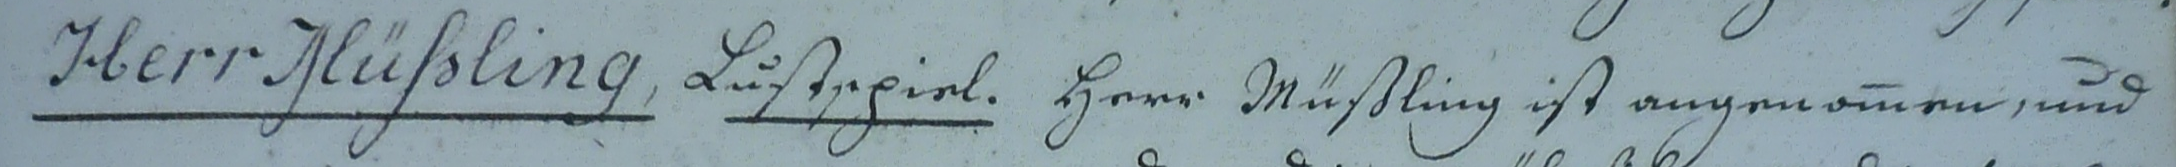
Herr Müssling, Lustspiel. Herr Müßling ist angenomen, und
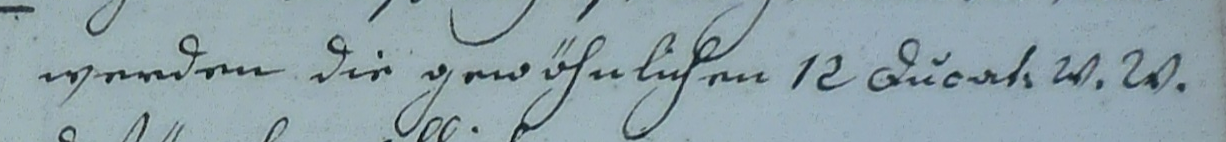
werden die gewöhnlichen 12 Ducat: W.W.
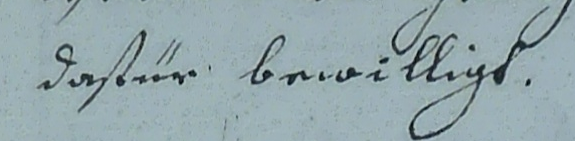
dafür bewilligt.
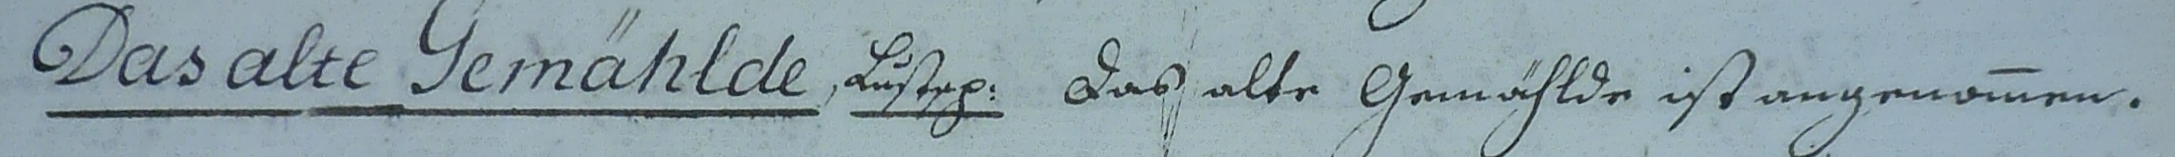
Das alte Gemählde, Lustsp: Das alte Gemählde ist angenom̅en.
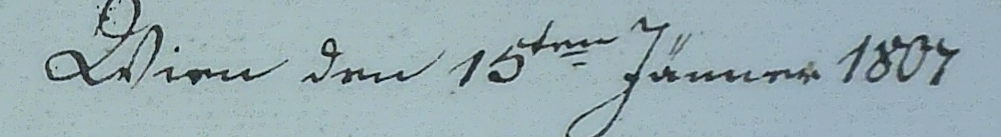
Wien den 15te͇n Jänner 1807
